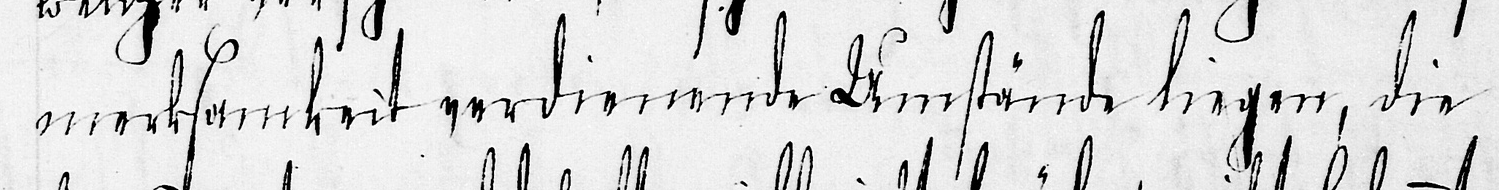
merksamkeit verdienende Umstände liegen, die
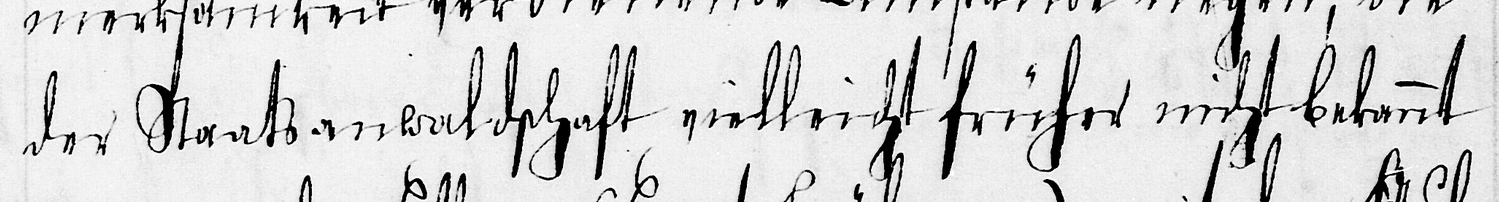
der Staatsanwaldschaft vielleicht früher nicht bekannt
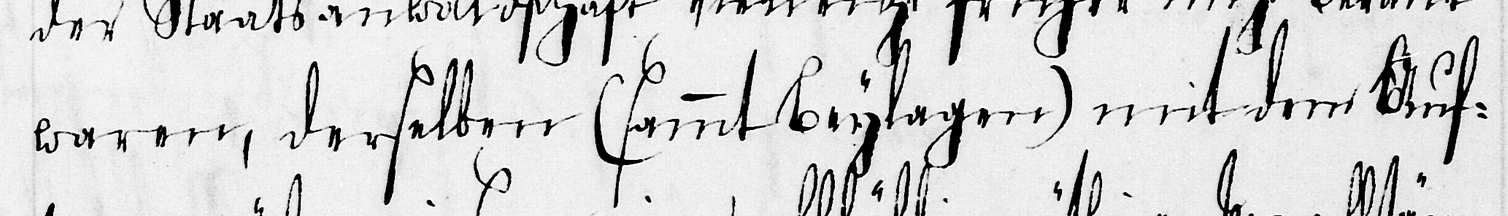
waren, derselben (sammt Beylagen) mit dem Auf¬
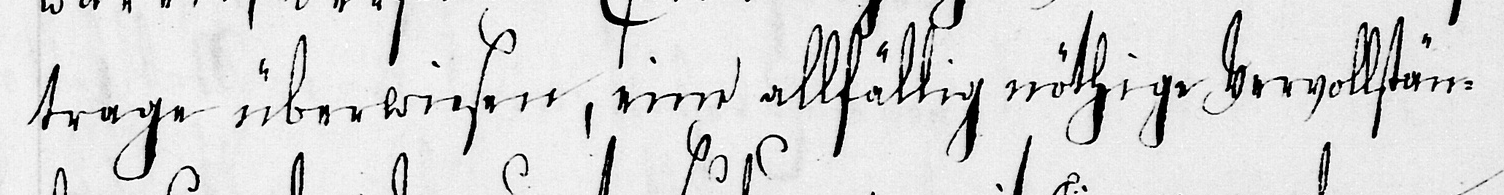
trage überwiesen, eine allfällig nöthige Vervollstän¬
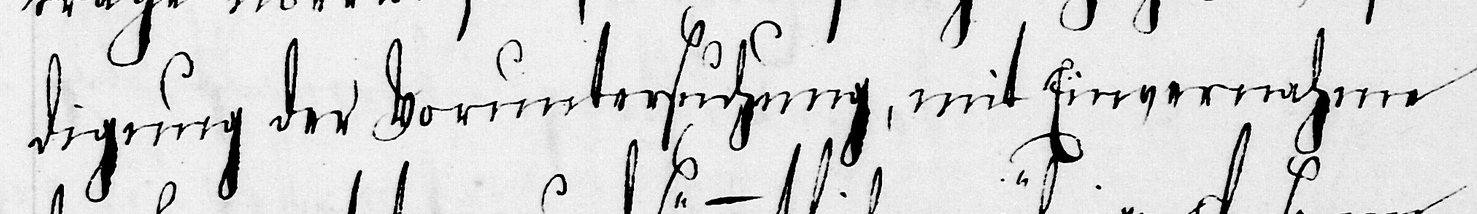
digung der Voruntersuchung, mit Einvernahme
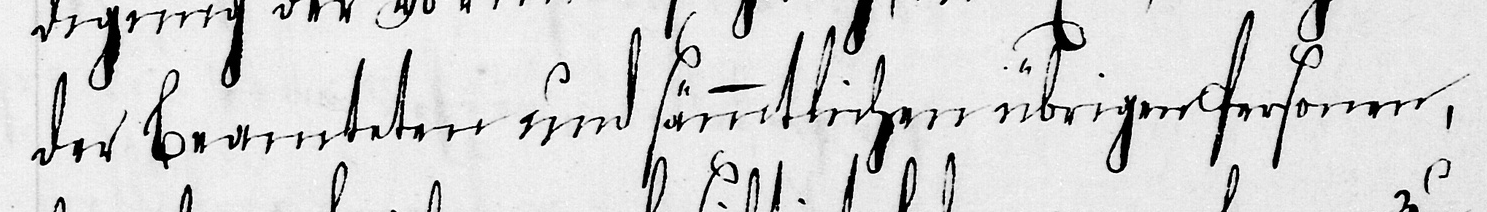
der Beamteten und sämmtlichen übrigen Personen,
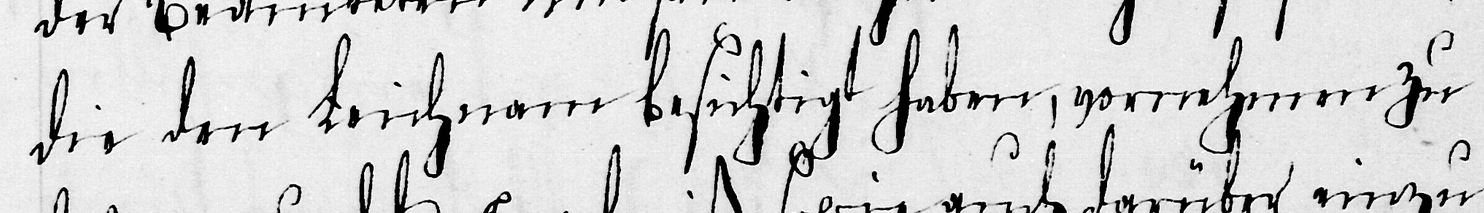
die den Leichnam besichtigt haben, vornehmen zu
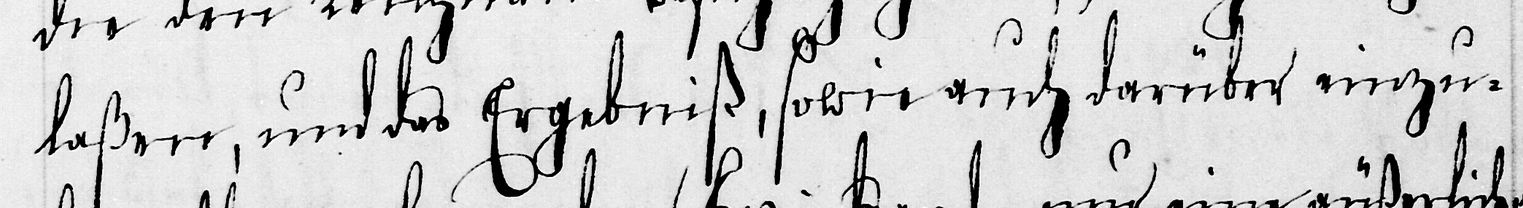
laßen, und das Ergebniß, sowie auch darüber einzu¬
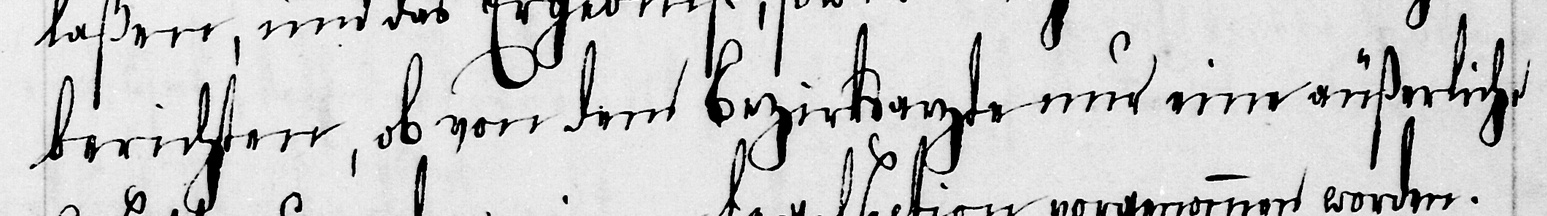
berichten, ob von dem Bezirksarzte nur eine äußerliche
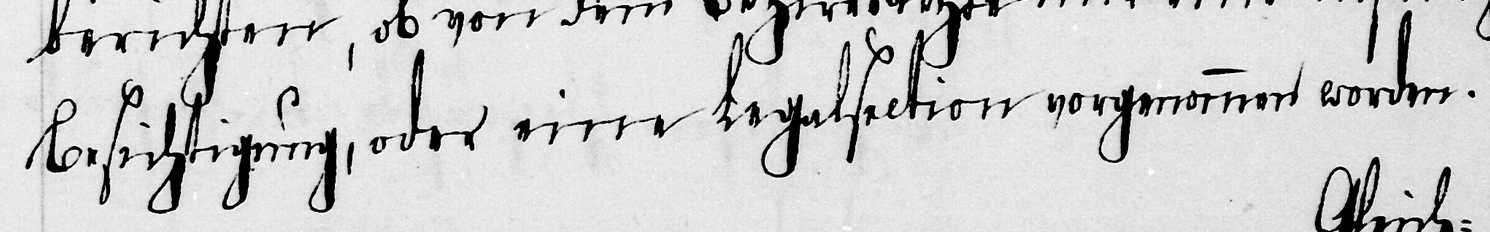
Besichtigung, oder eine Legalsection vorgenommen worden.
